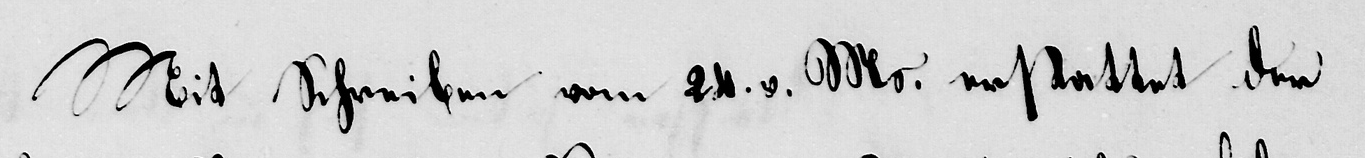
Mit Schreiben vom 24. v. Ms. erstattet der
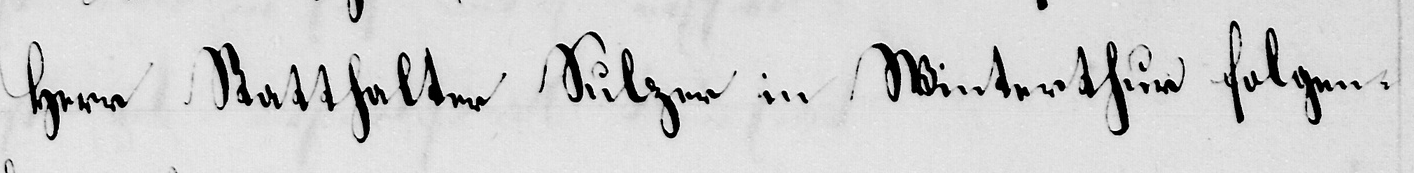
Herr Statthalter Sulzer in Winterthur folgen¬
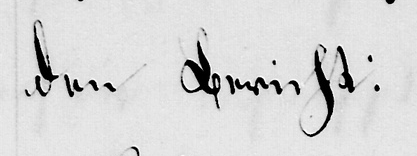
den Bericht:
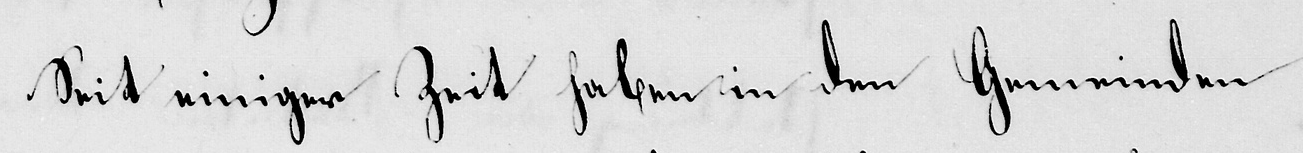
Seit einiger Zeit haben in den Gemeinden
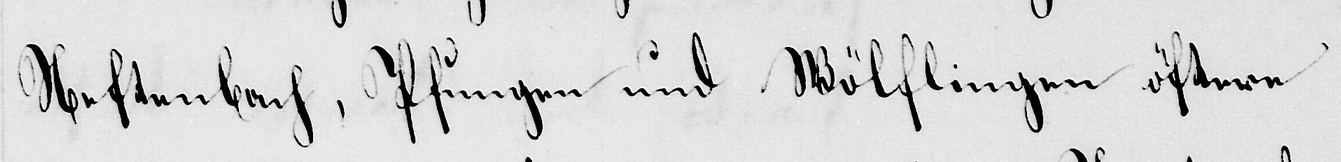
Neftenbach, Pfungen und Wülflingen öftere
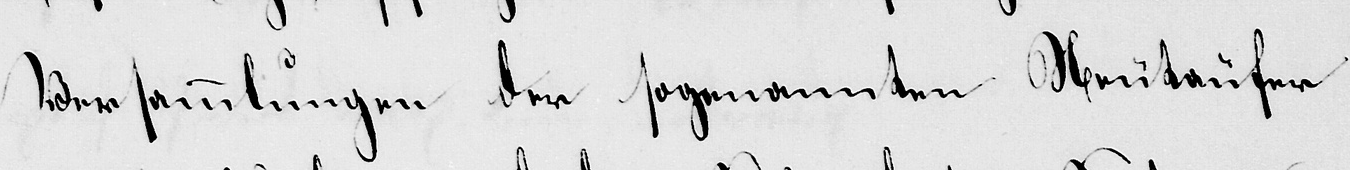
Versammlungen der sogenannten Neutäufer
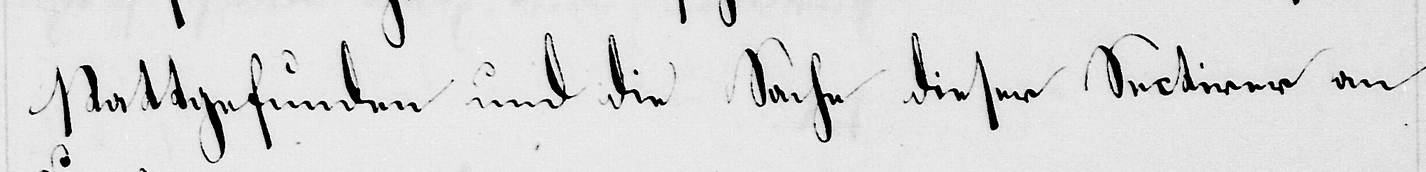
stattgefunden und die Sache dieser Sectierer an
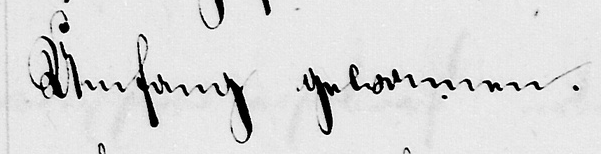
Umfang genommen.
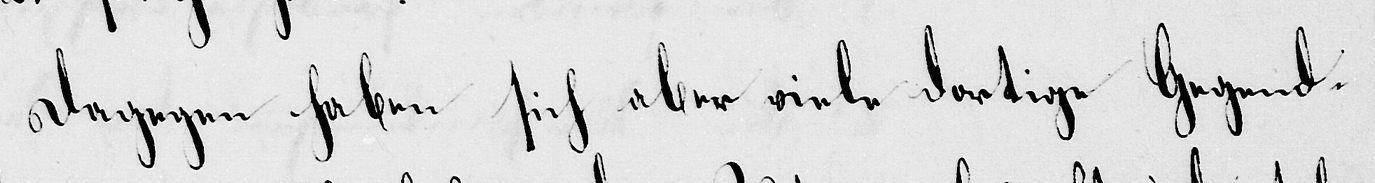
Dagegen haben sich aber viele dortige Gegend¬
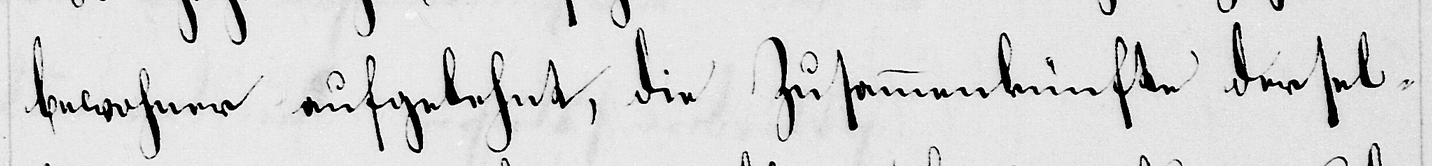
bewohner aufgelehnt, die Zusammenkünfte dersel¬
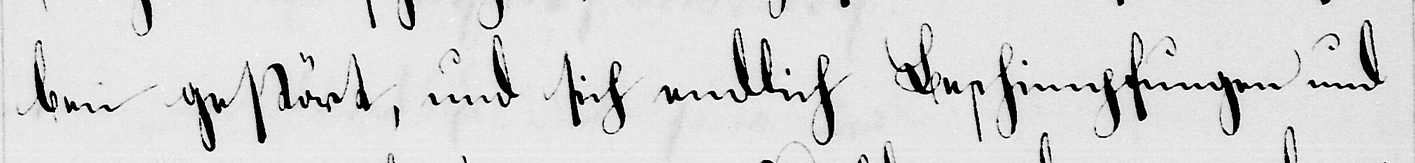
ben gestört, und sich endlich Beschimpfungen und
